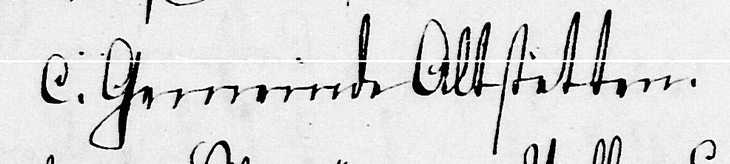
C. Gemeinde Altstetten.
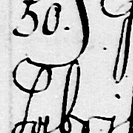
er.
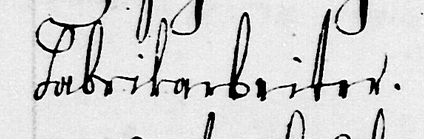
Fabrikarbeiter.
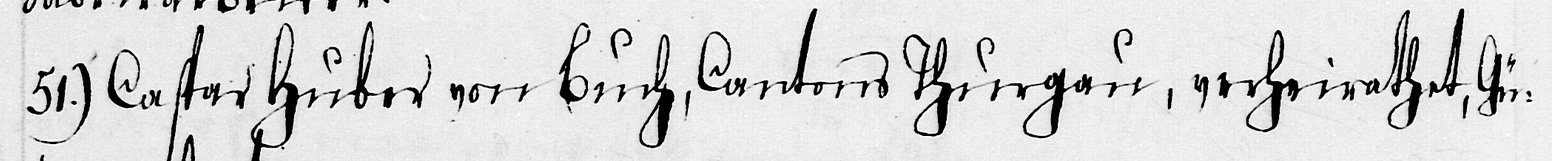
51.) Caspar Huber von Buch, Cantons Thurgau, verheirathet, Gü¬
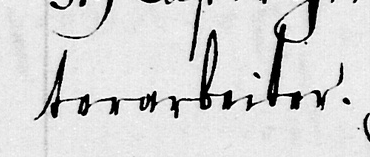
terarbeiter.
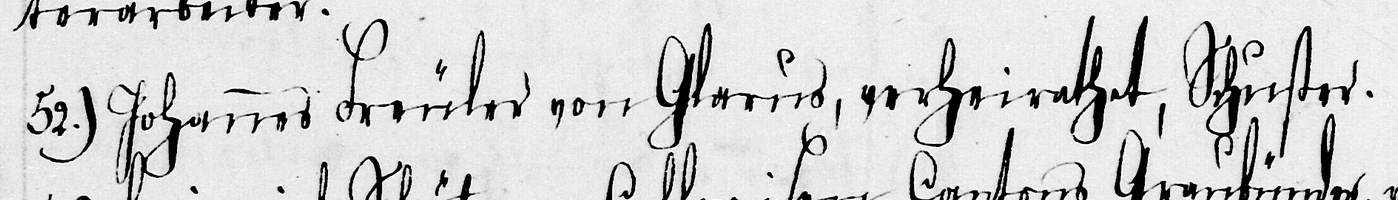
52.) Johannes Freuler von Glarus, verheirathet, Schuster.
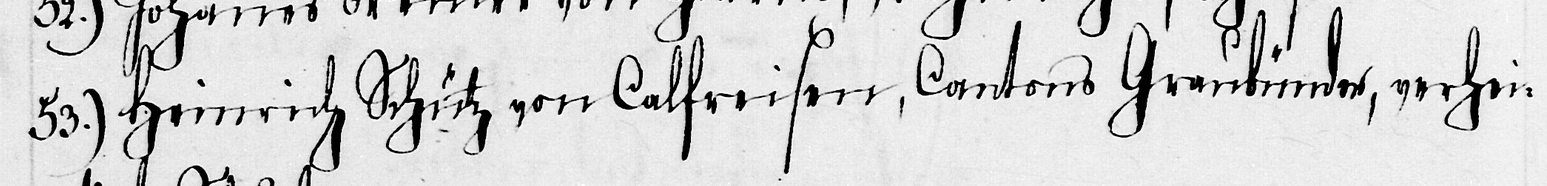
53.) Heinrich Schütz von Calfreisen, Cantons Graubünden, verhei¬
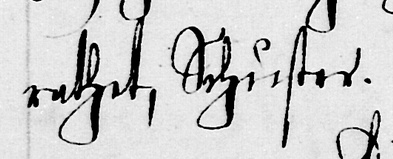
rathet, Schuster.
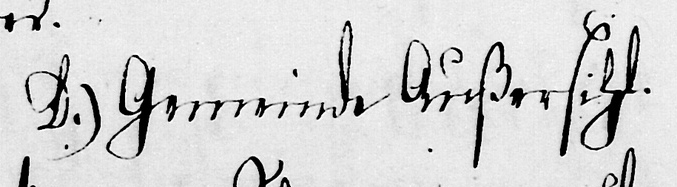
D.) Gemeinde Außersihl.
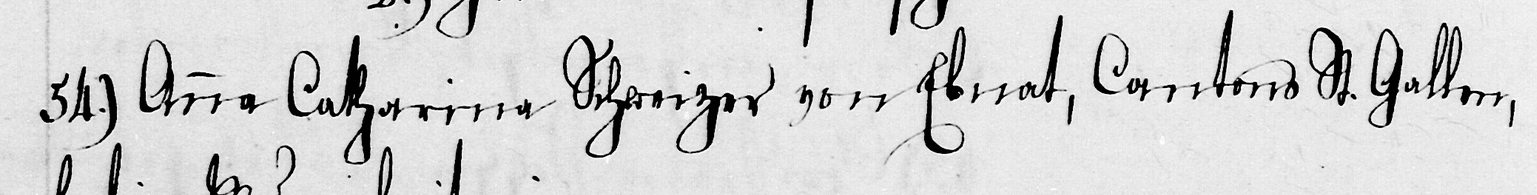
54.) Anna Catharina Schweizer von Ebnat, Cantons St. Gallen,
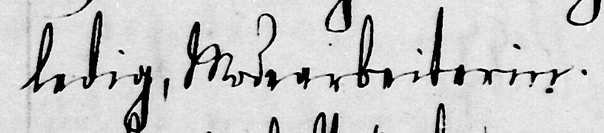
ledig, Modearbeiterin.
